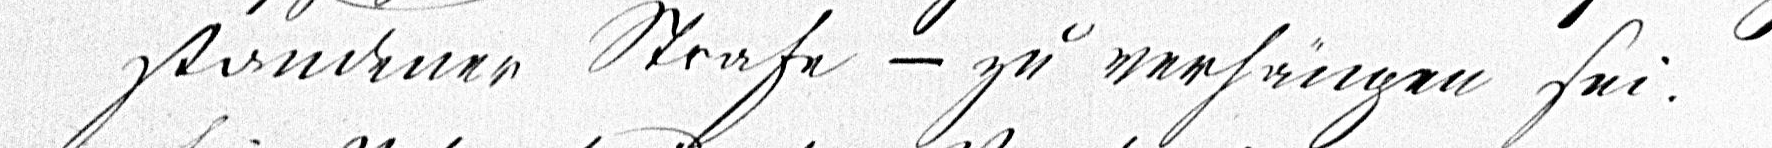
standener Strafe - zu verhängen sei.
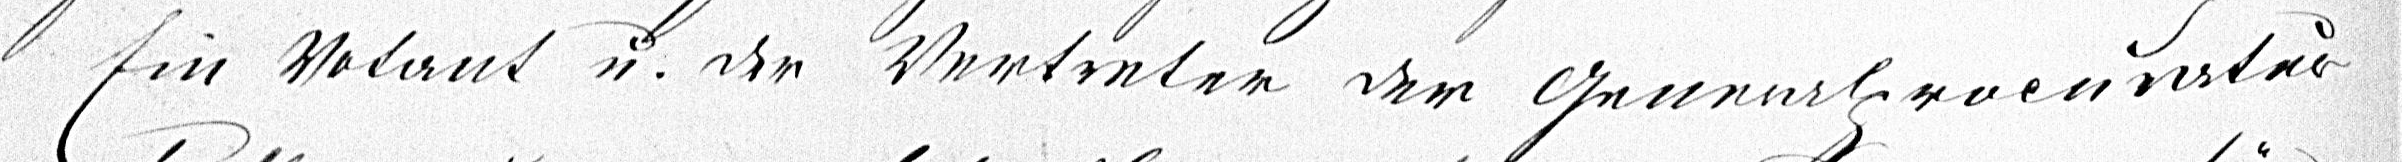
Ein Volant u. der Vertreter der Generalprocuratur
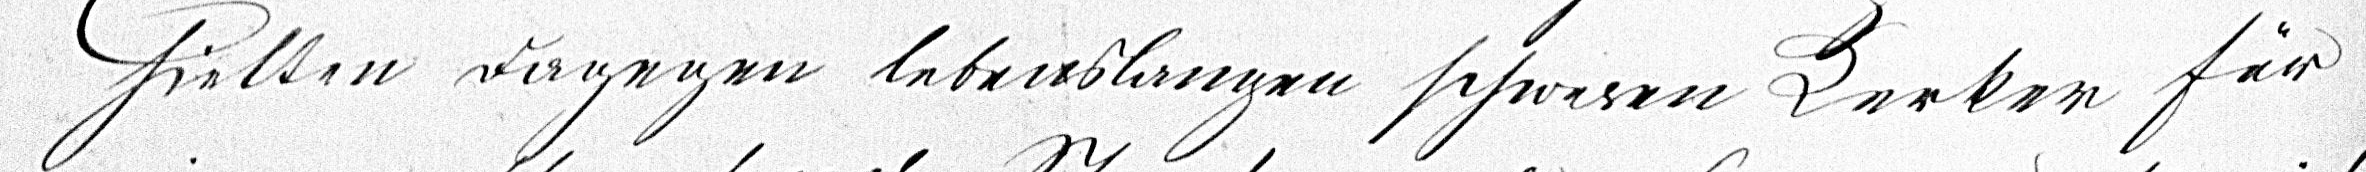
hielten dagegen lebenslangen schweren Kerker für
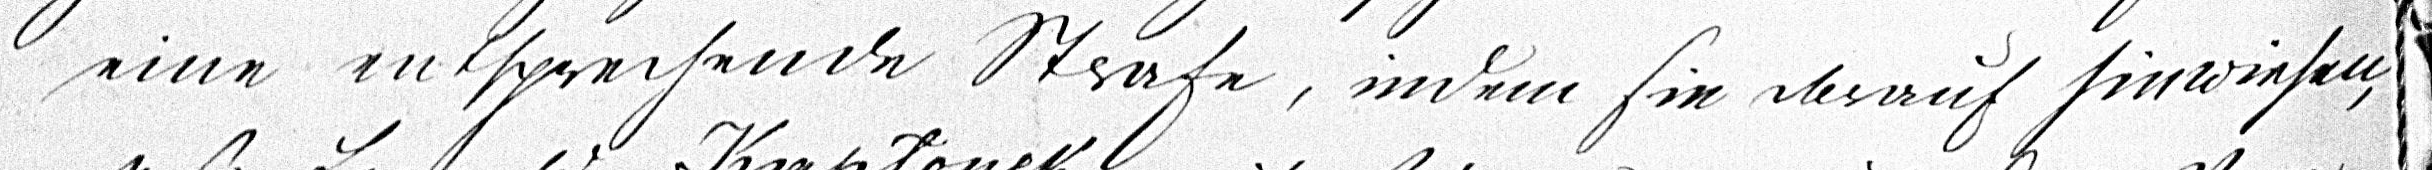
entsprechende Strafe, indem sie darauf hinwiesen,
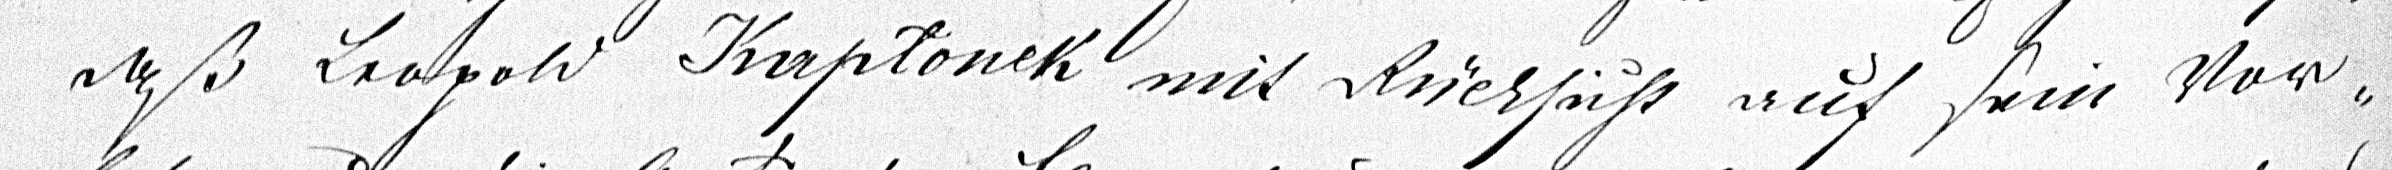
daß Leopold Kaptonek mit Rücksicht auf sein Vor¬
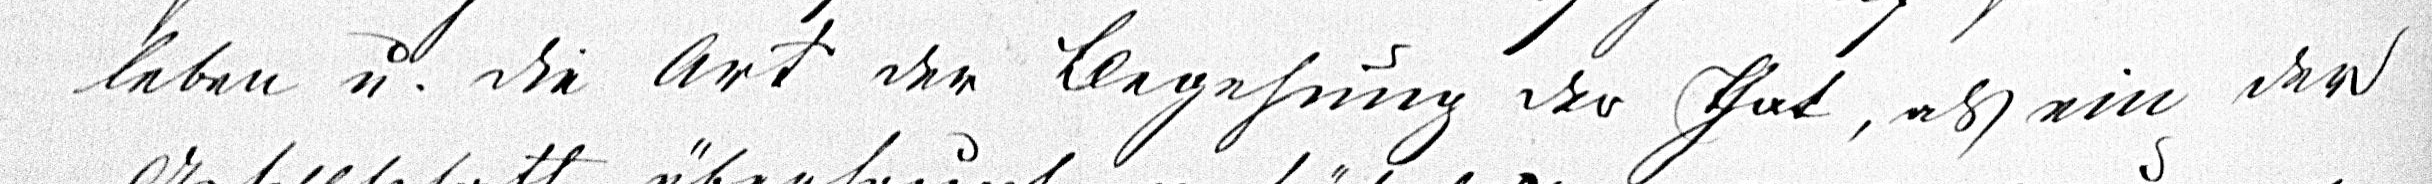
leben u. die Art der Begehung der That, als ein der
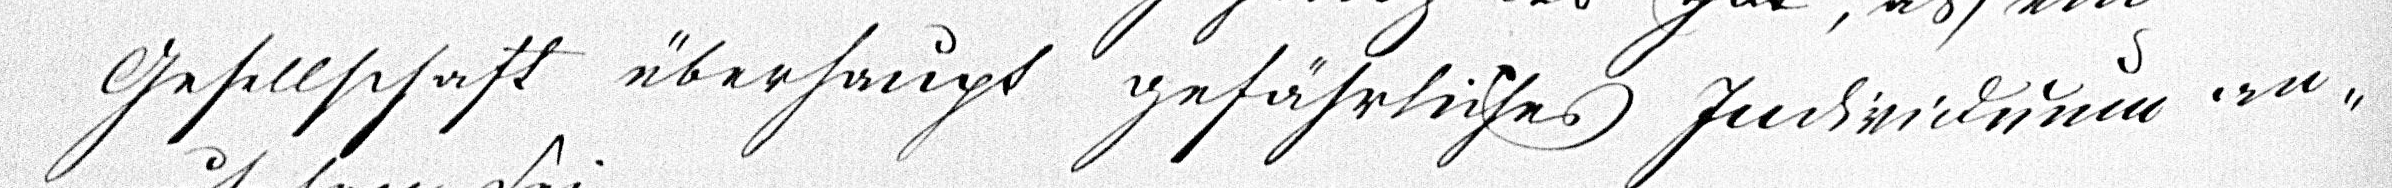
Gesellschaft überhaupt gefährliches Invividuum an¬
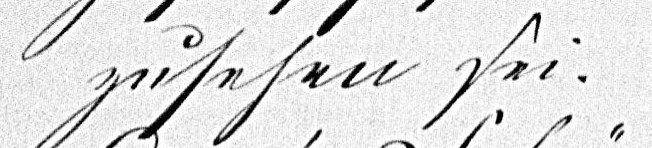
zusehen sei.
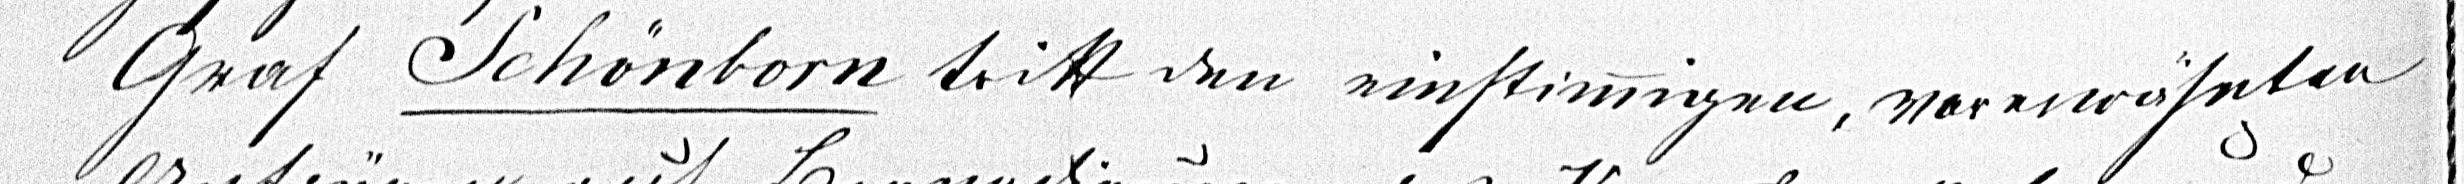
Graf Schönborn tritt den einstimmigen, vorerwähnten
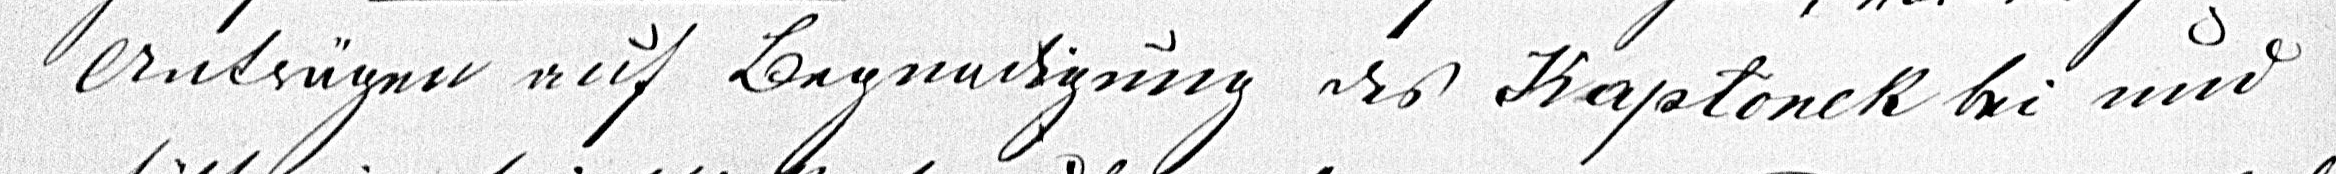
Anträgen auf Begnadigung des Kaptonck bei und
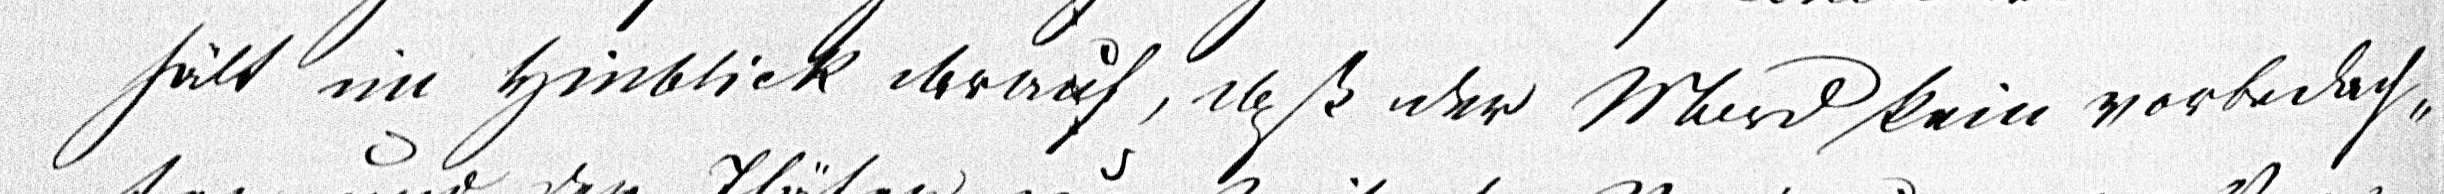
hält im Hinblick darauf, daß der Mord kein vorbedach¬
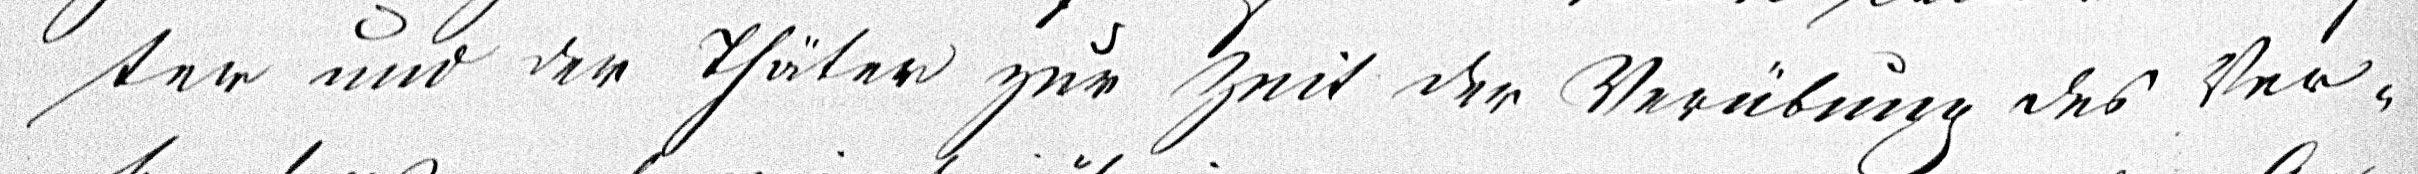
ter und der Thäter zur Zeit der Verübung des Ver¬
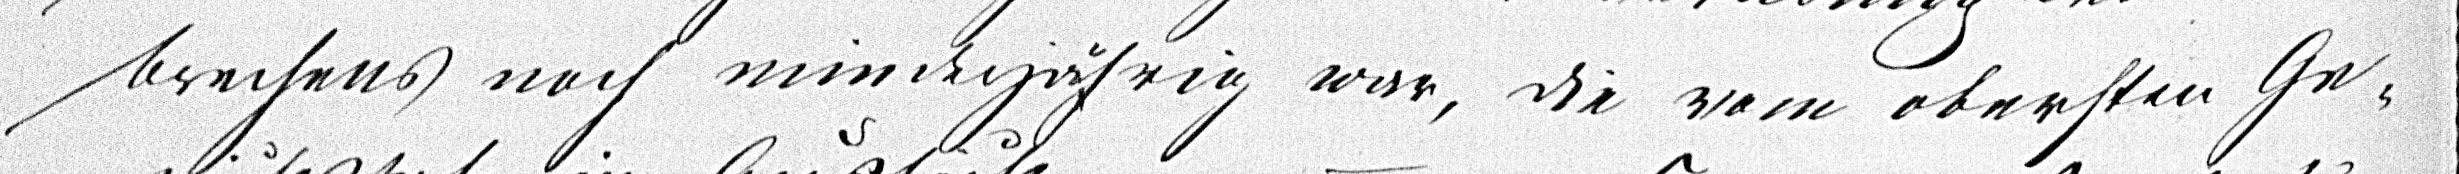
brechens nach minderjährig war, die vom obersten Ge¬
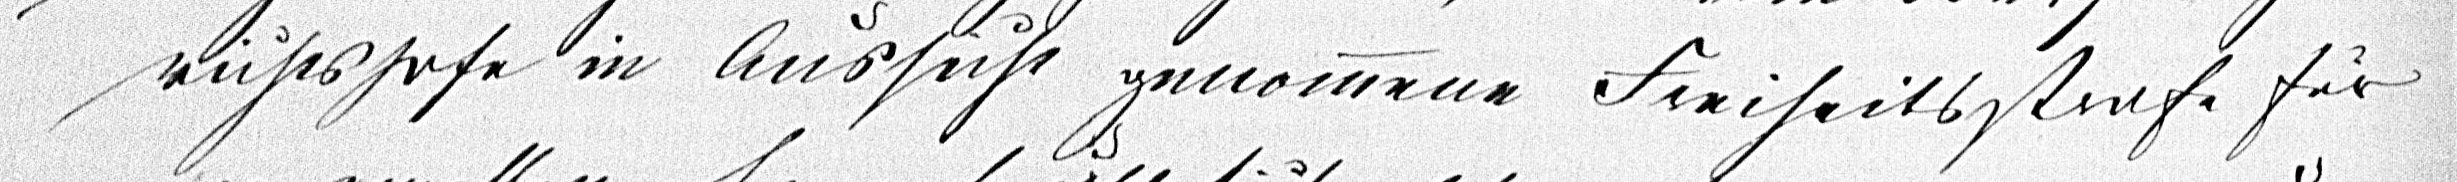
richtshofe in Aussicht genommene Freiheitsstrafe für
